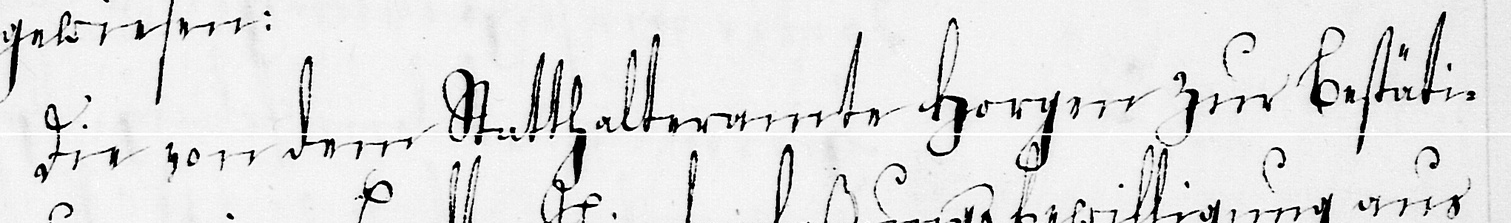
Die von dem Statthalteramte Horgen zur Bestäti¬
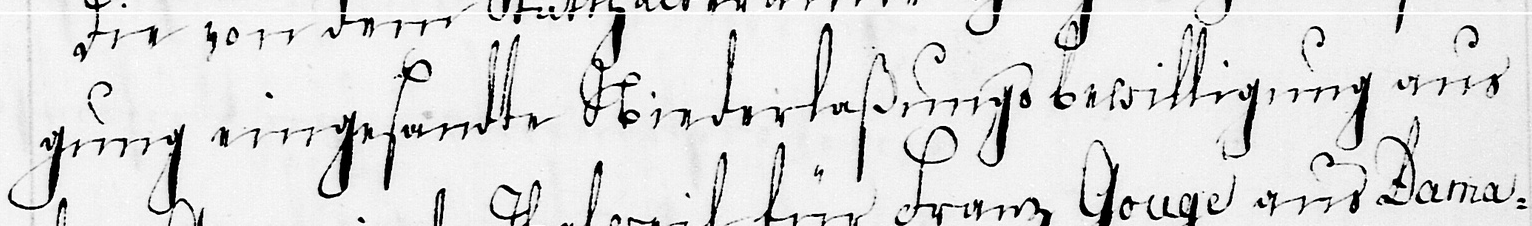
gung eingesandte Niederlaßungsbewilligung aus
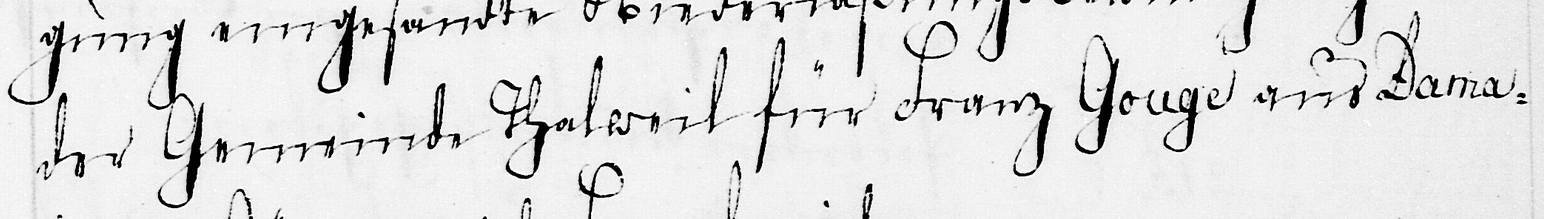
der Gemeinde Thalweil für Franz Gouge aus Dama-S¬
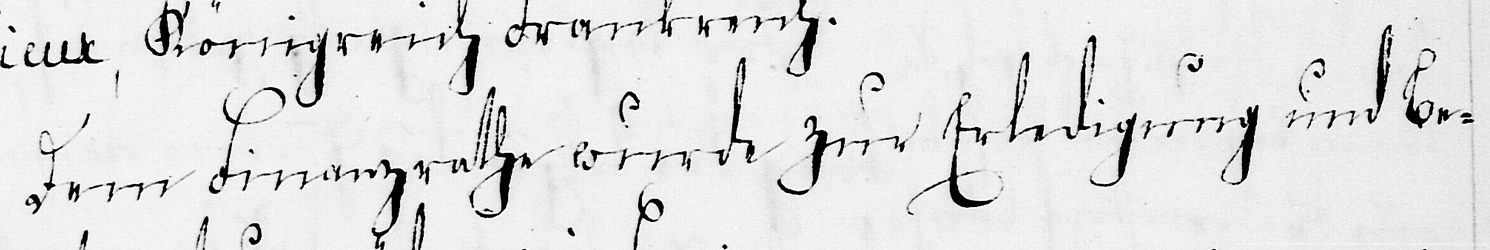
Dem Finanzrathe wurde zur Erledigung und Be¬
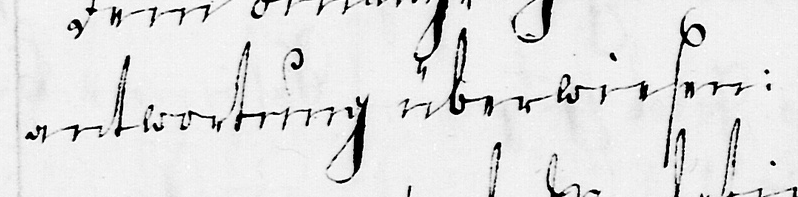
antwortung überwiesen:
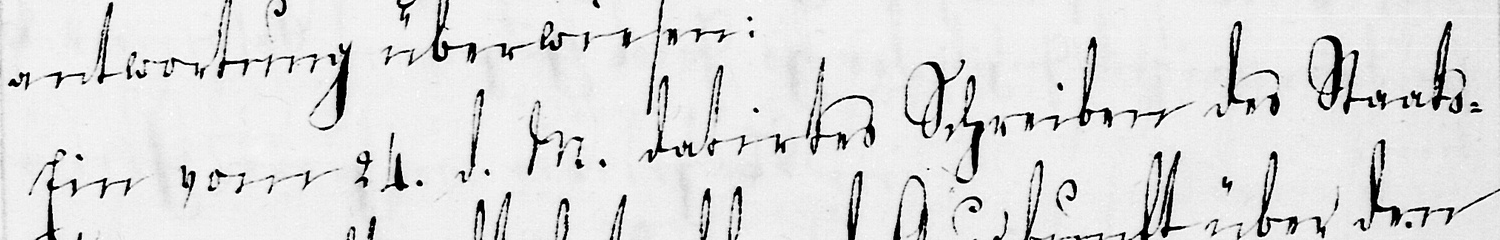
Ein vom 24. d. M. datirtes Schreiben des Staats¬
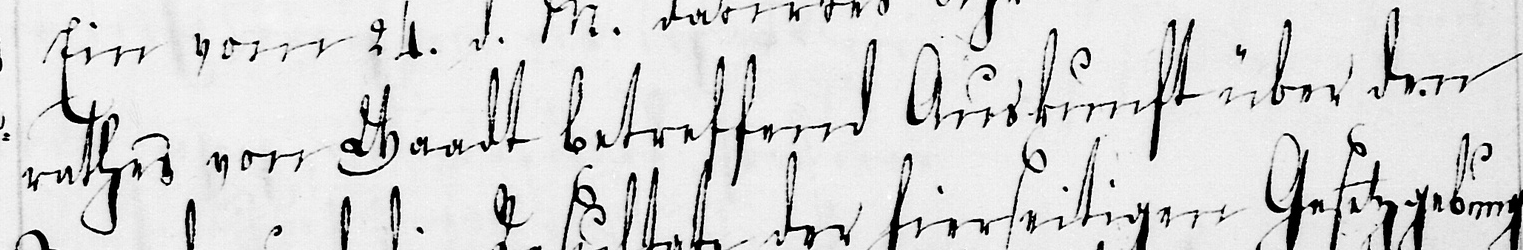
rathes von Waadt betreffend Auskunft über den
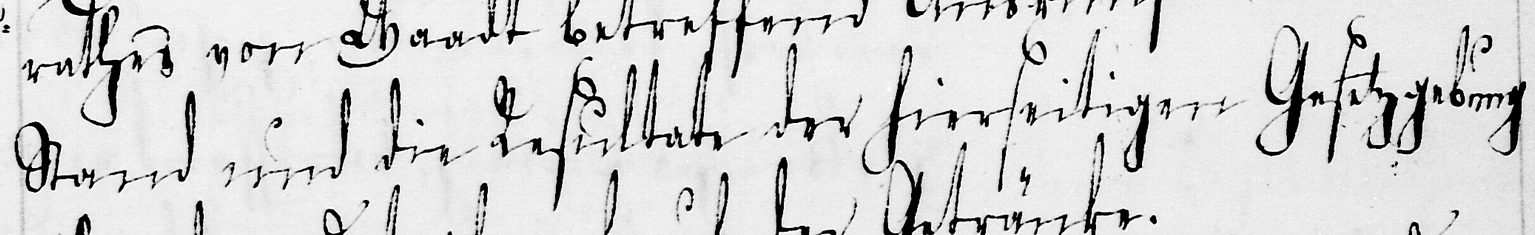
Stand und die Resultate der hierseitigen Gesetzgebu¬
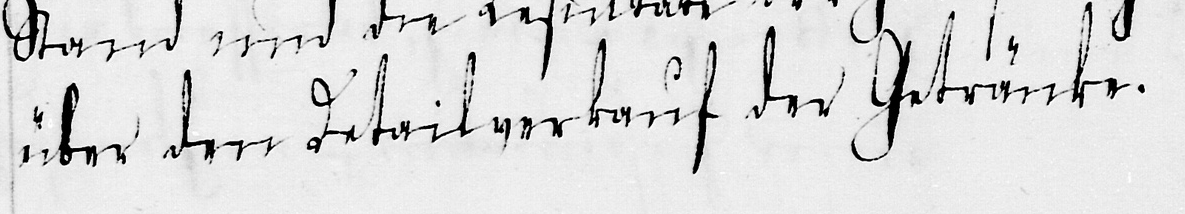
über den Detailverkauf der Getränke.
